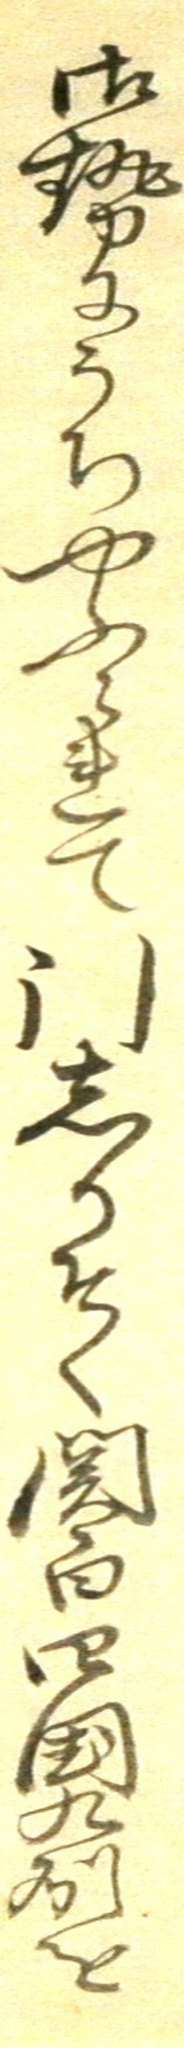御勢にうちやふれて引しりそく関白四国九州を
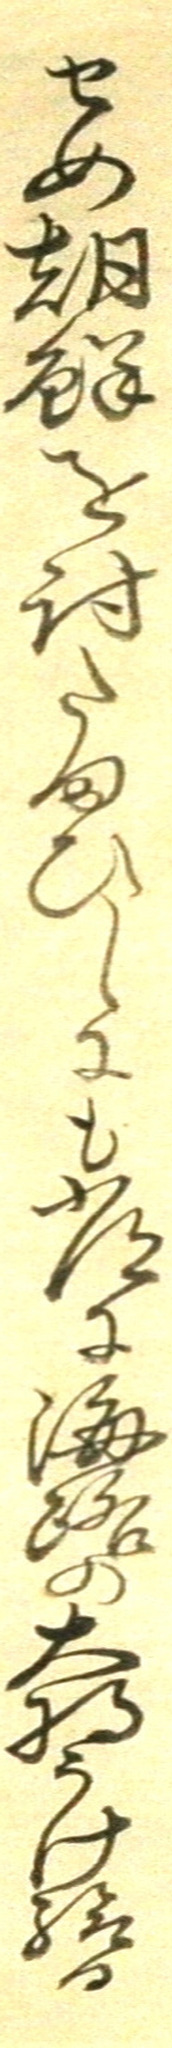せめ朝鮮を討たまひしにも常に海路の大将うけ給る
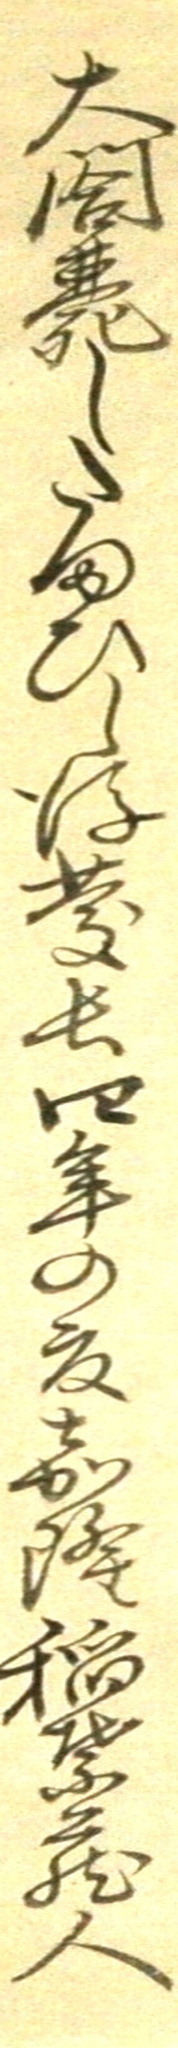太閤薨したまひし後慶長四年の夏嘉隆稲葉蔵人
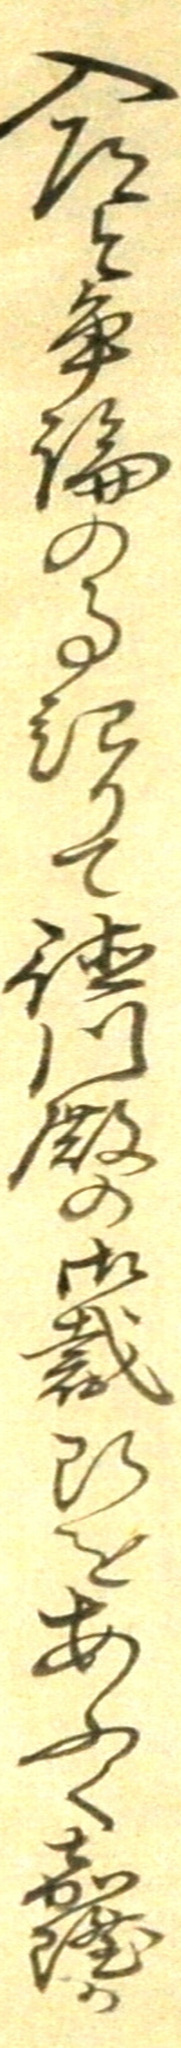入道と争論の事起りて徳川殿の御裁断をあふく嘉隆か
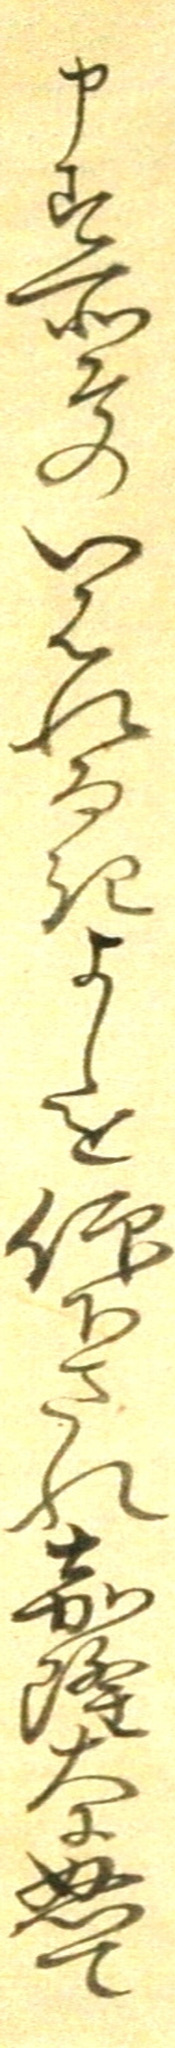申す所そのいはれなきよしを仰下され嘉隆大に怒て
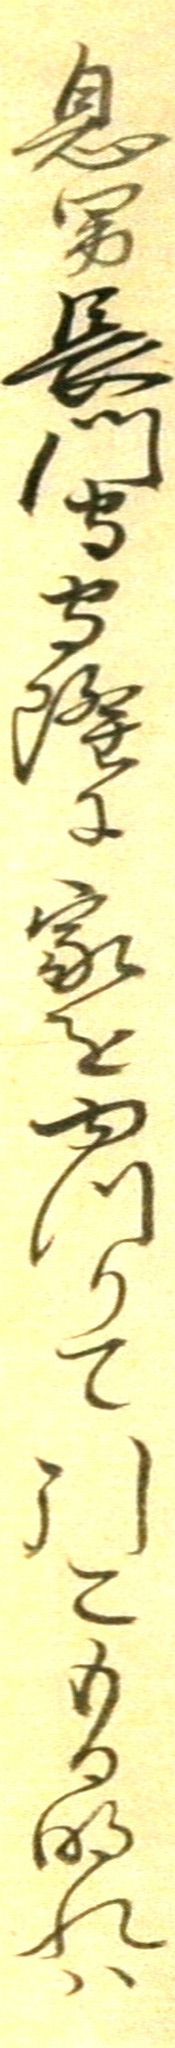息男長門守守隆に家をゆつりて引こもる明れは

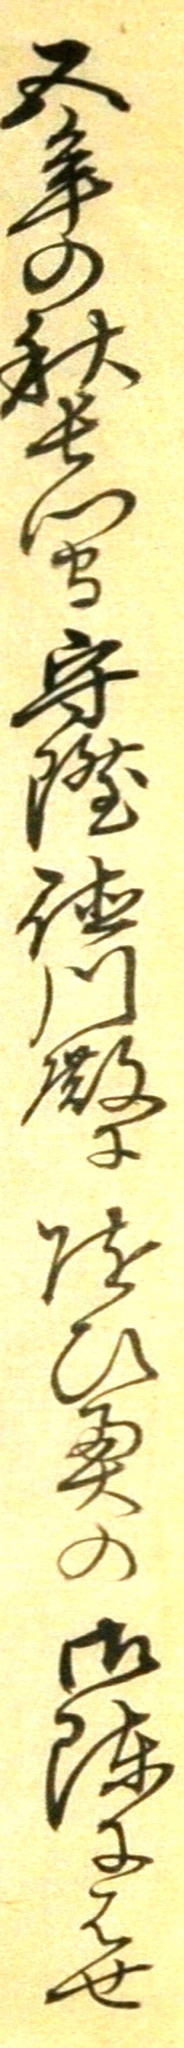五年の秋長門守守隆徳川殿に随ひ奥の御陣にはせ
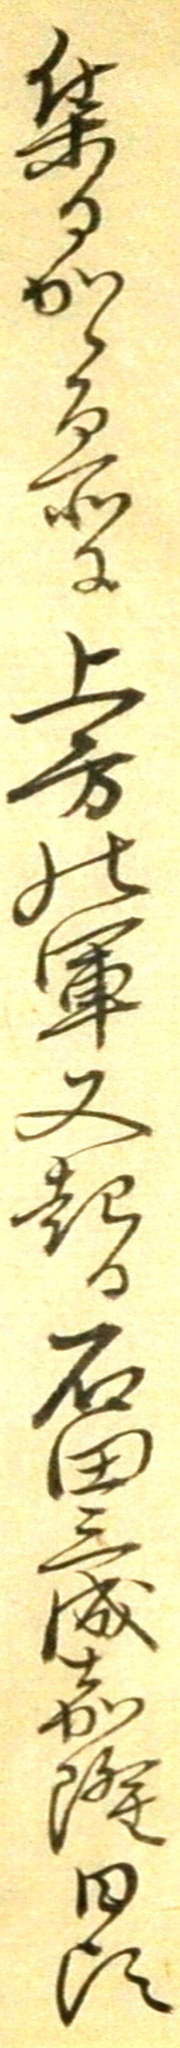集るかゝる所に上方の軍又起る石田三成嘉隆日頃
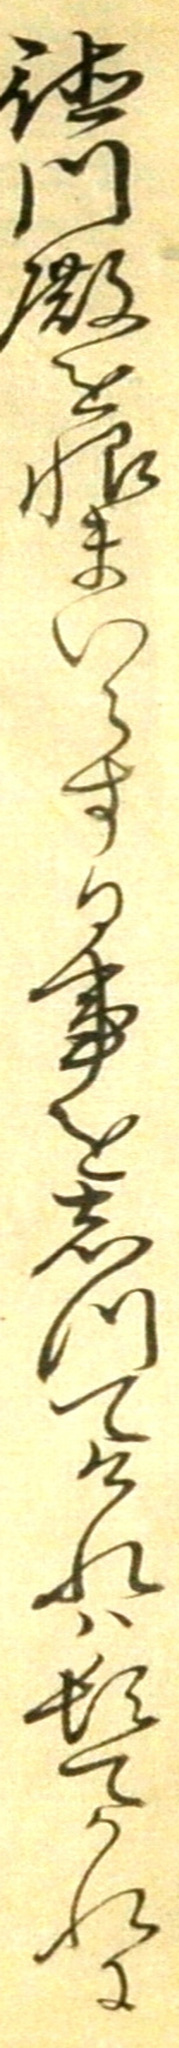徳川殿を恨まいらする事をしつてけれは頓てかれに
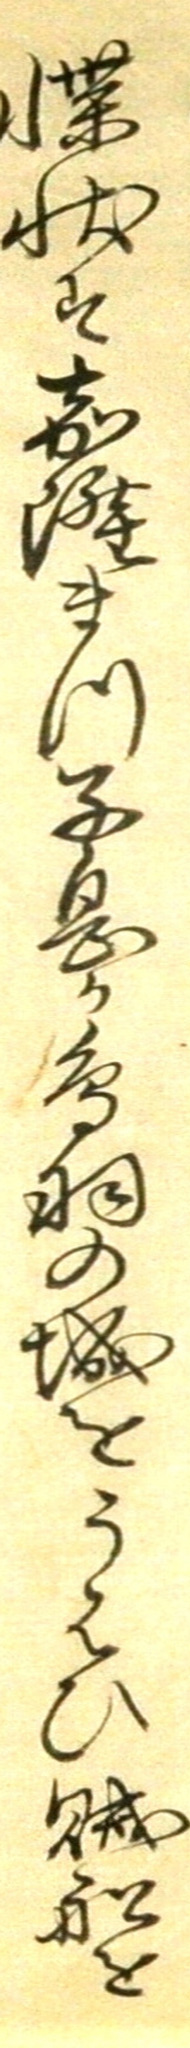牒状す嘉隆まつ子息か鳥羽の城をうはひ賊船を
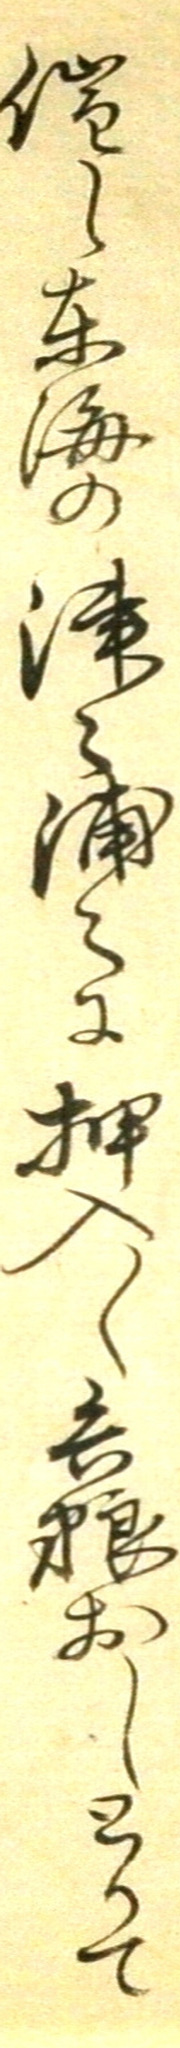催し東海の津々浦々に押入〳〵兵粮おしとりて
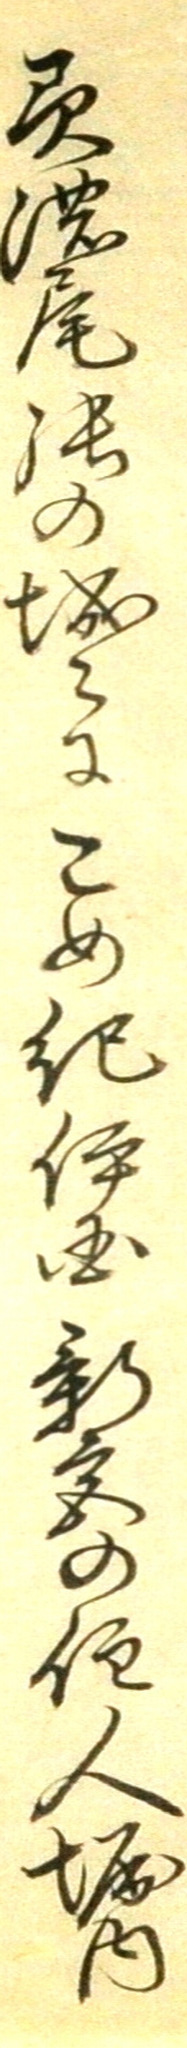美濃尾張の城々にこめ紀伊国新宮の住人堀内
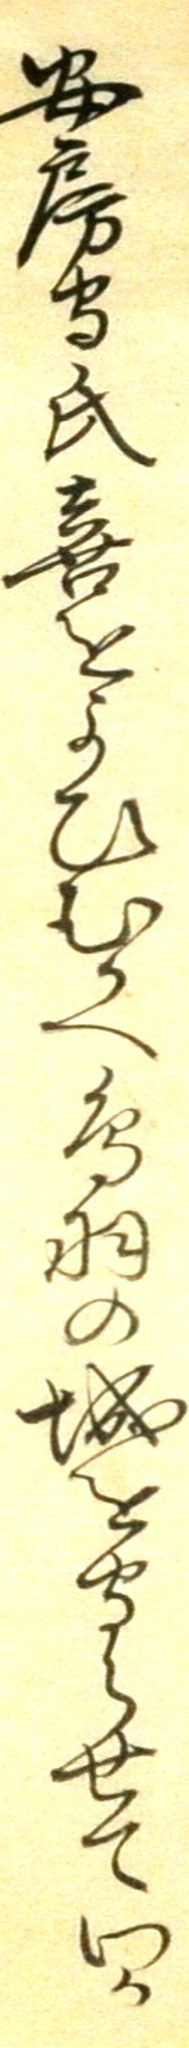安房守氏喜をよひむかへ鳥羽の城を守らせてわか
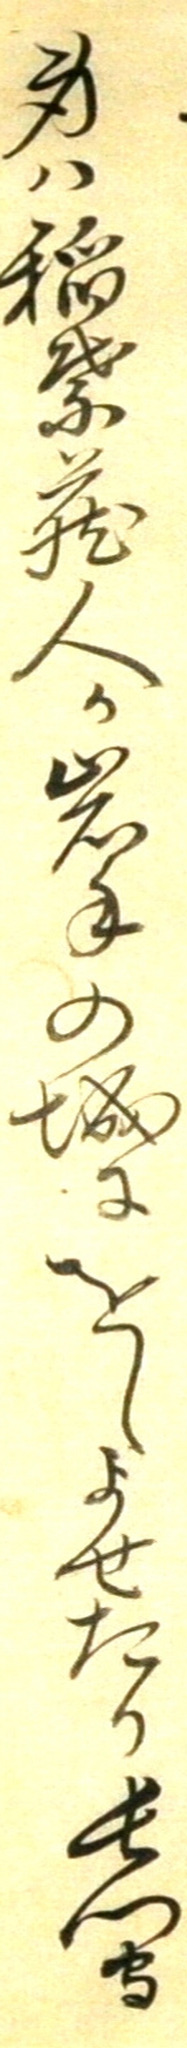身は稲葉蔵人か岩手の城にをしよせたり長門守
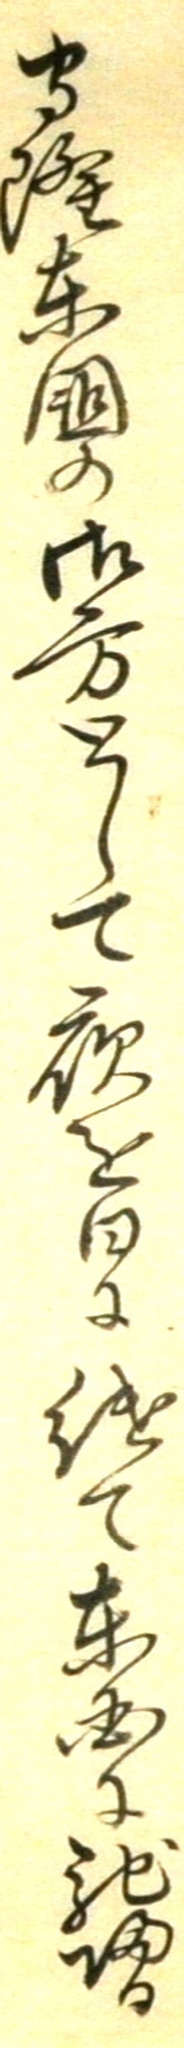守隆東国の御方として夜を日に継て東国に馳帰る
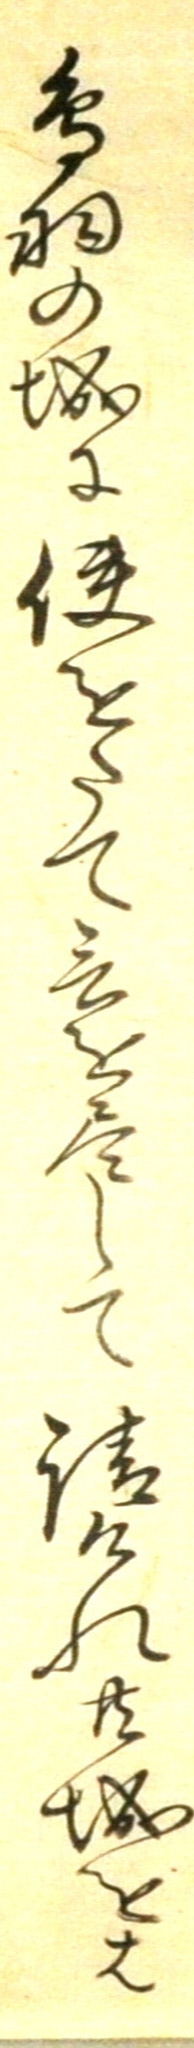鳥羽の城に使をたて言を尽して請けれ共城をは
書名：藩翰譜（九・上）
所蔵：伊那市立高遠町図書館・合同会社AMANE
